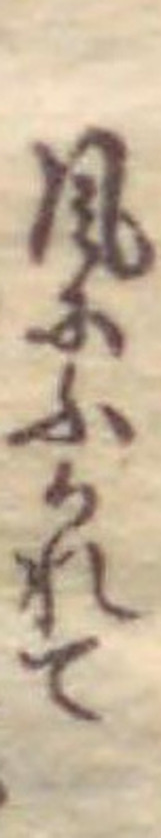風にふかれて
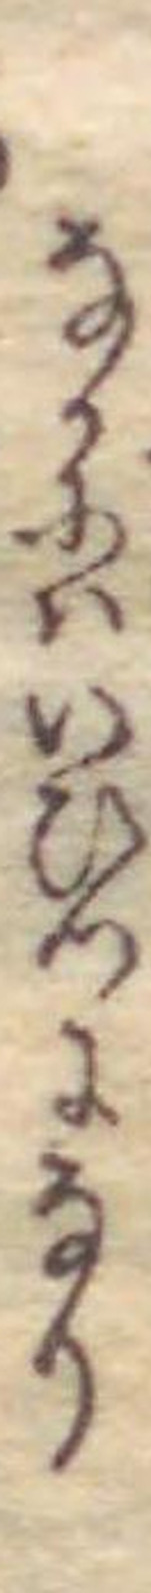なかにはいひつになり
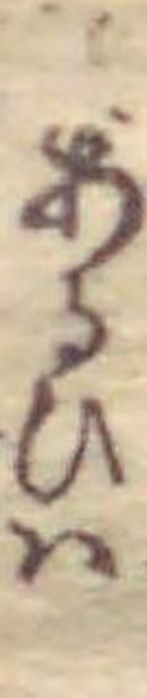あるひは
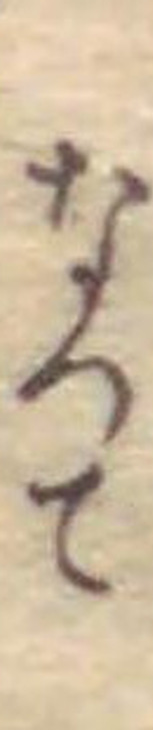なつて
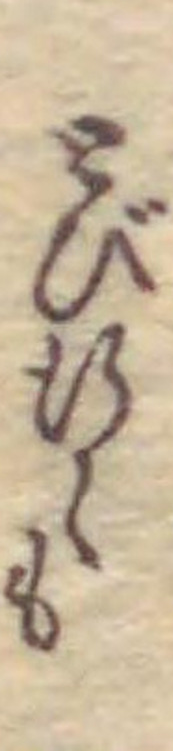とび行くも
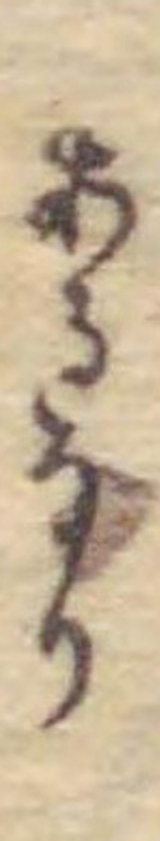あるなり

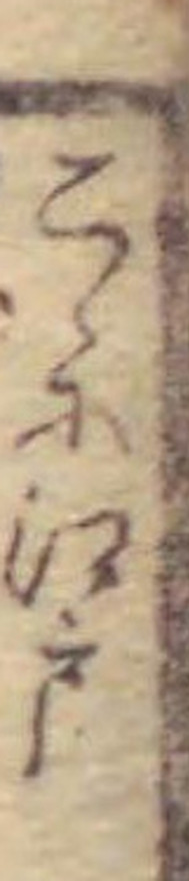こゝに江戸
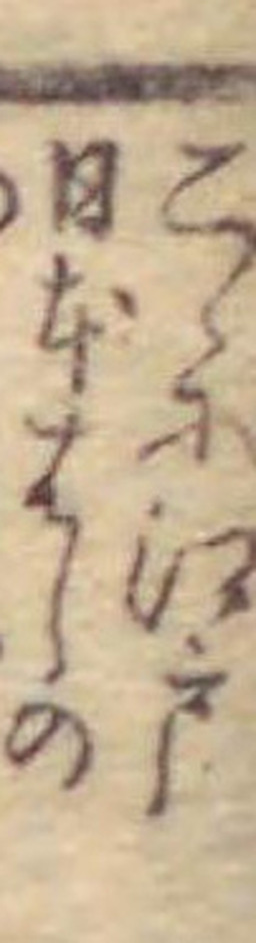日本はしの
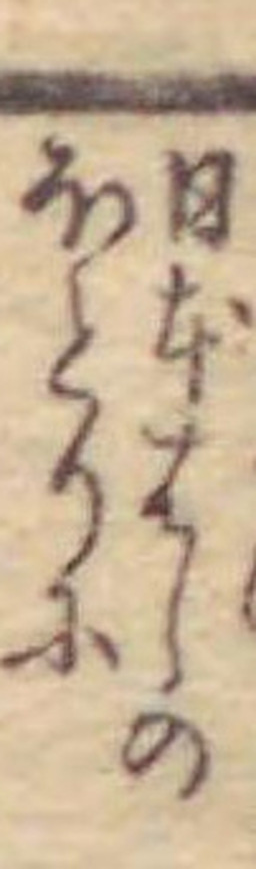ほとりに
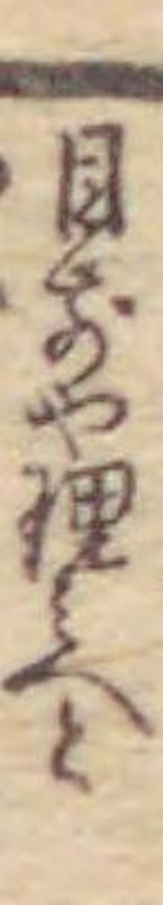目前や理兵へと
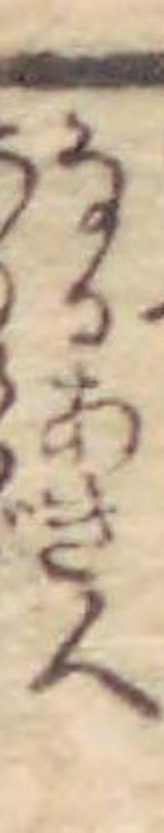なるあき人
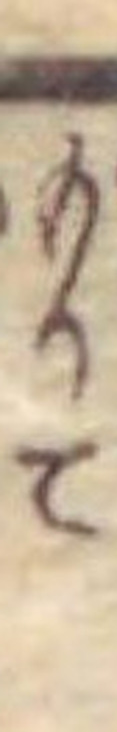もりて
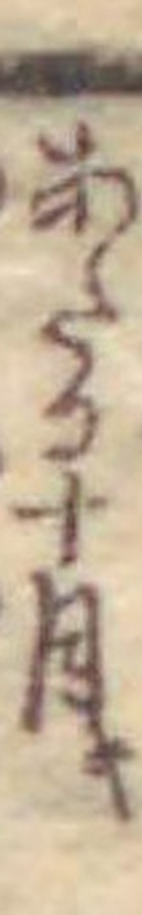あたる十月き
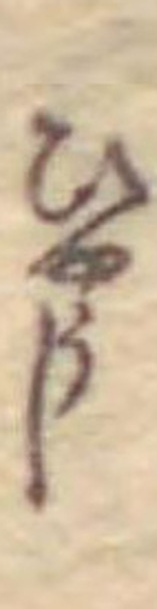ひやうし
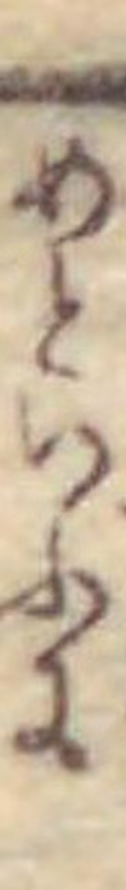めといふに
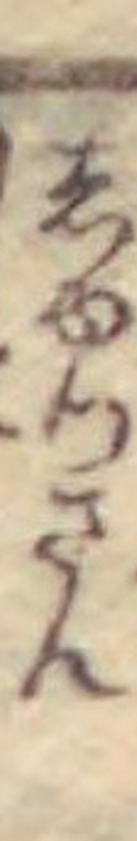しゆつさん
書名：心学早染艸 : 3巻
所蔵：国立国会図書館 National Diet Library, JAPAN
